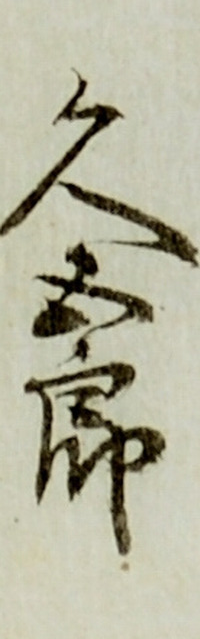久五郎
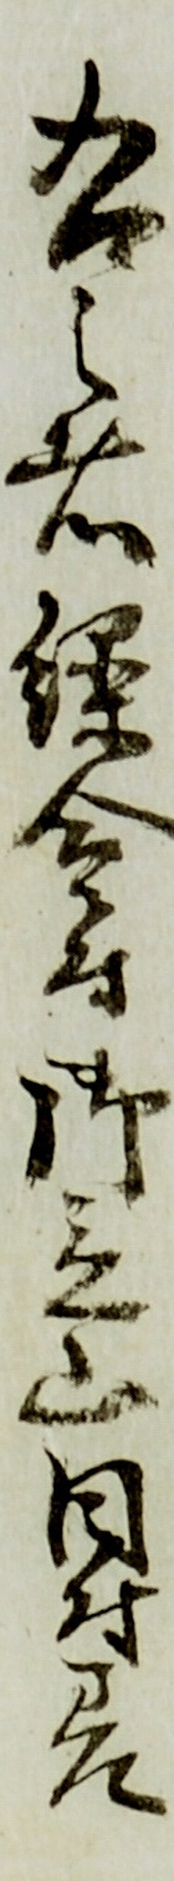右之者繰合に付御立山目付差
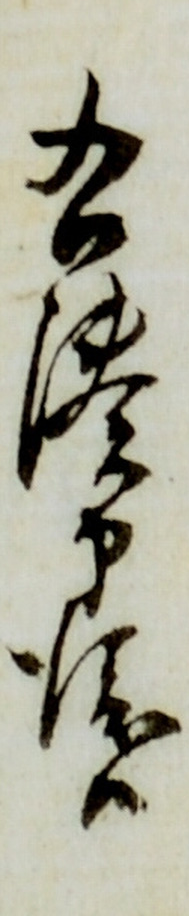右湊申渡候
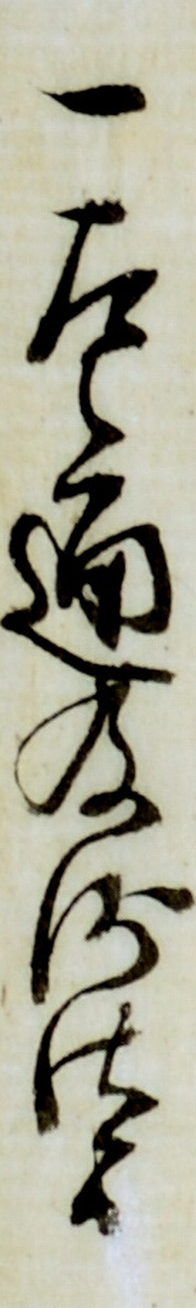一左之通及沙汰候
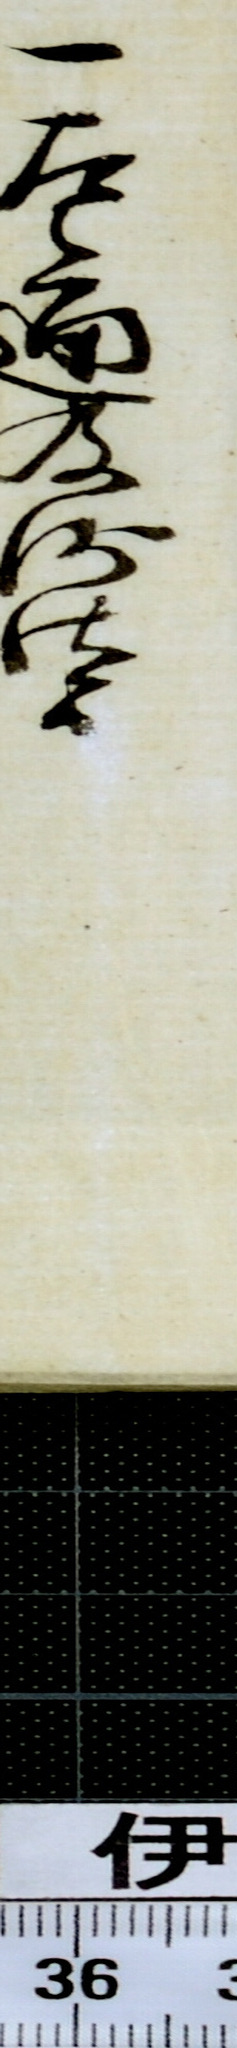一左之通及沙汰候
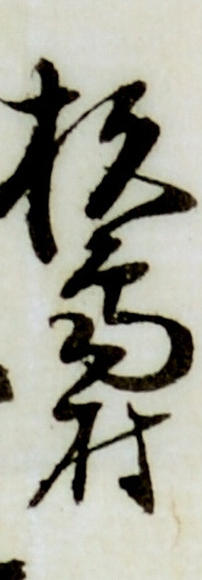杉島村
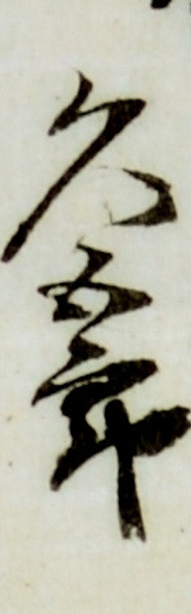久五郎

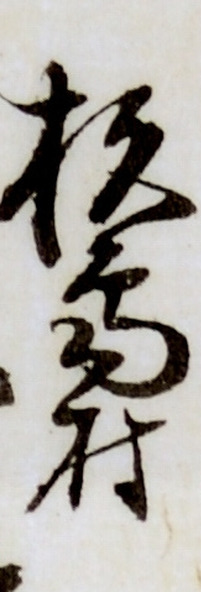杉島村
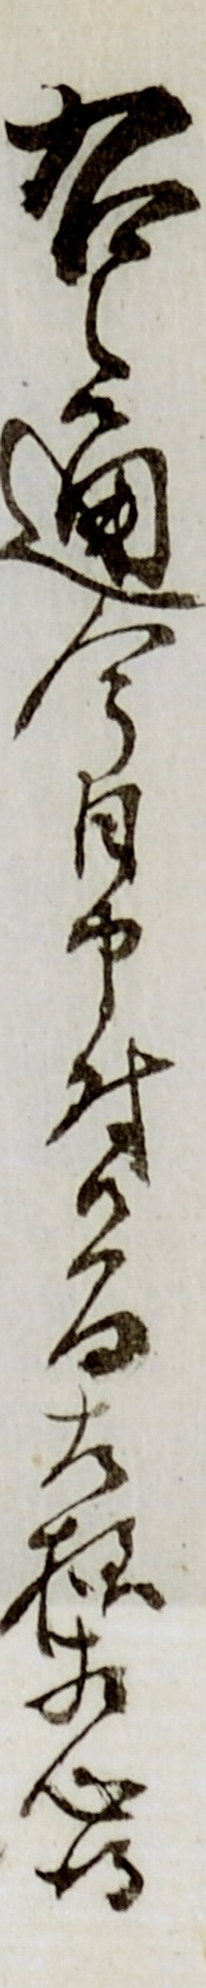右之通今日申付候間左様相心得
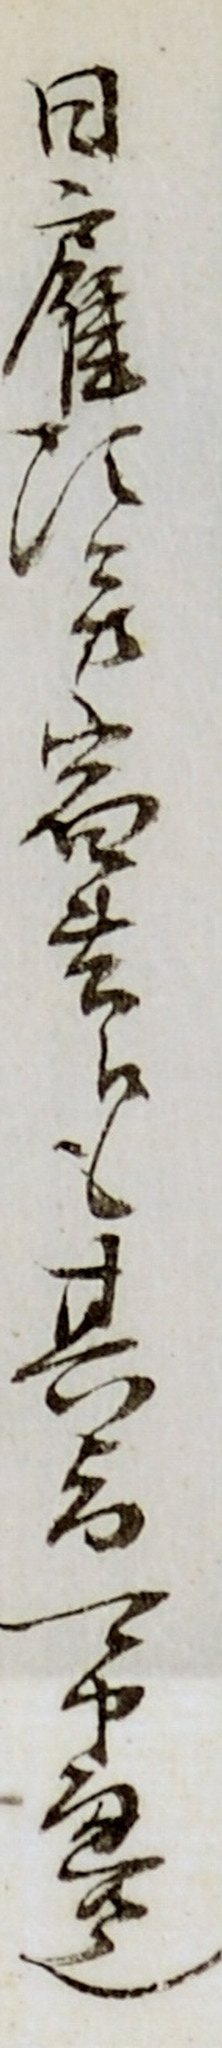日雇頭并宿共えも其旨可申通候也
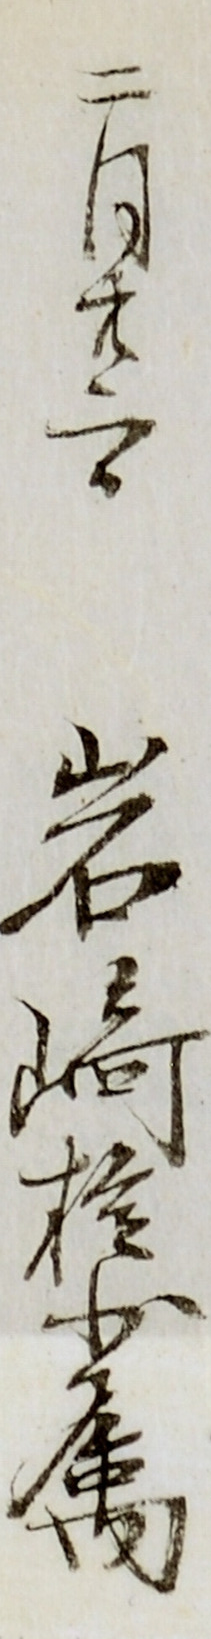二月廿二日岩崎権少属
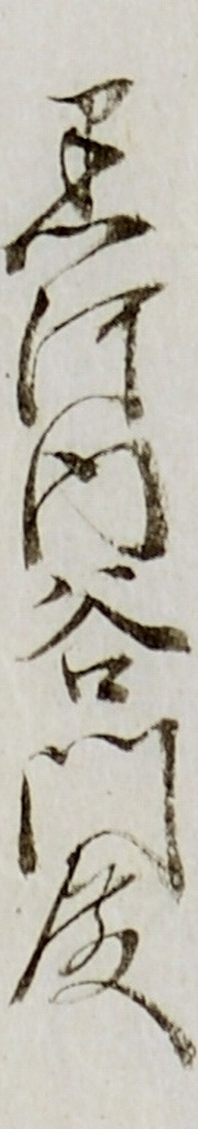黒河内谷門殿
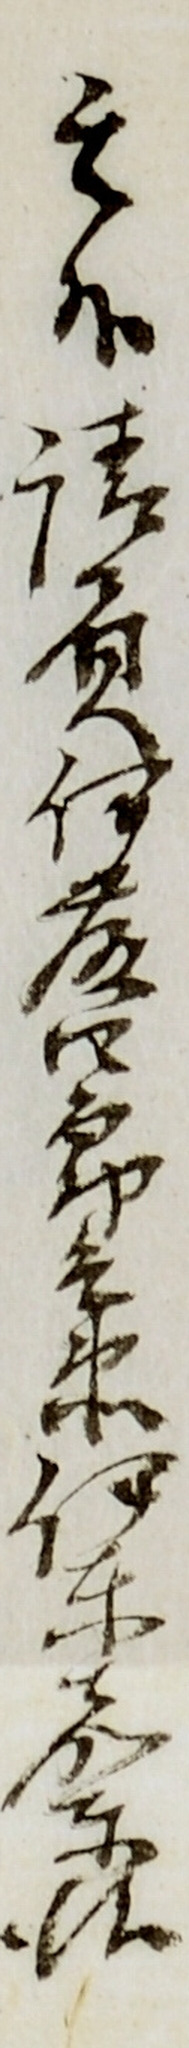其外請負伊藤四郎兵衛伊東嘉東治
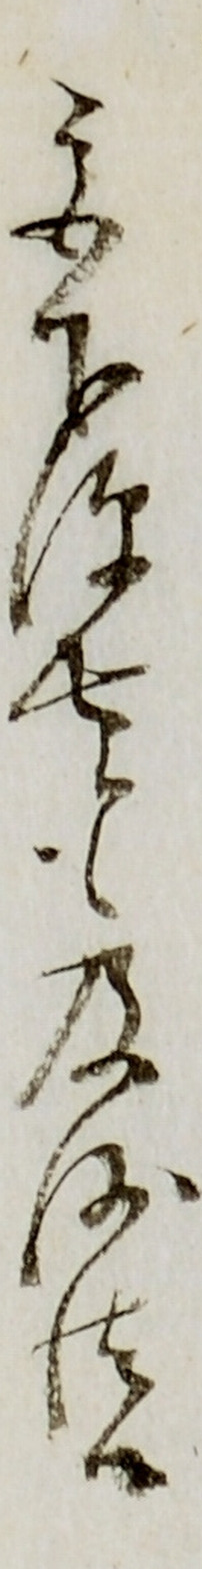宮下深七えも及沙汰候
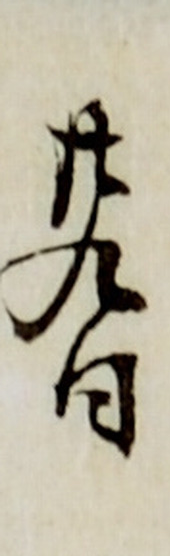廿九日
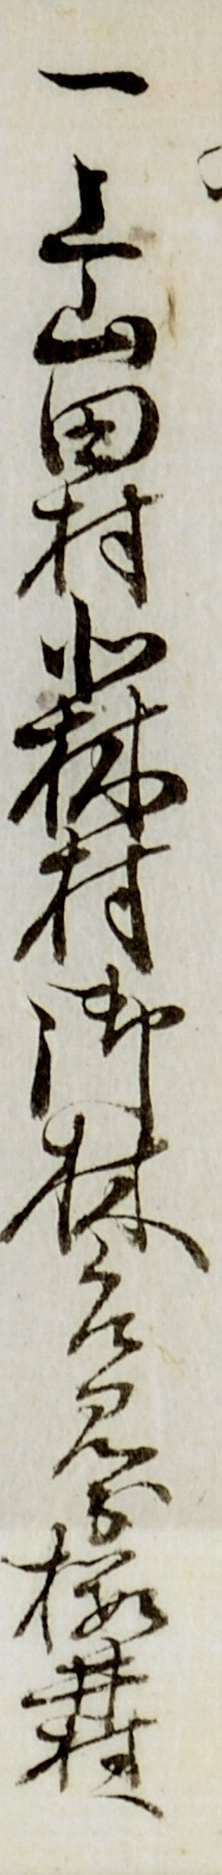一上山田村北林村御林被見分桜井村へ
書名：山林方諸事御用留
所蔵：伊那市立高遠町図書館・合同会社AMANE
